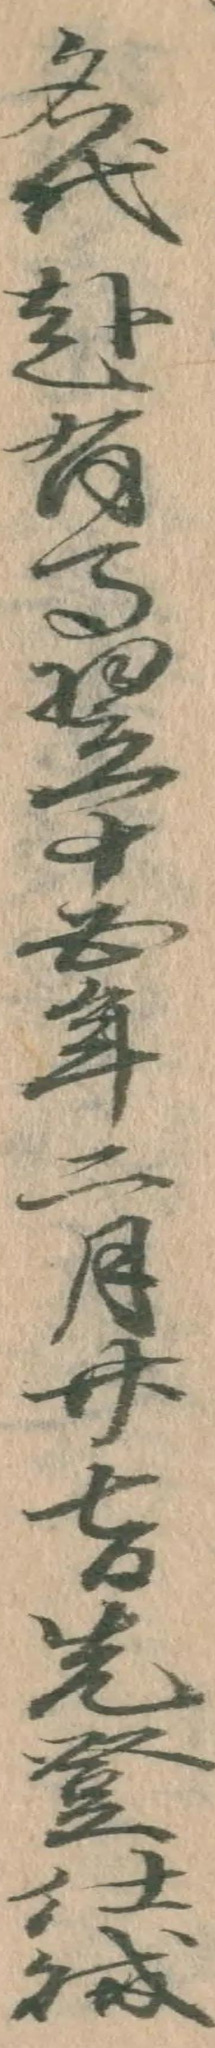名代赴有馬翌十五年二月二十七日先登仕賊

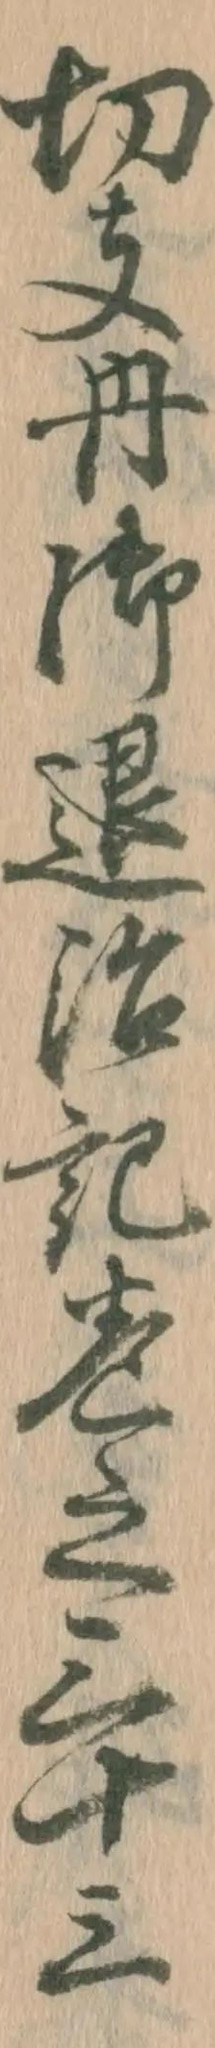切支丹御退治記巻之三十三
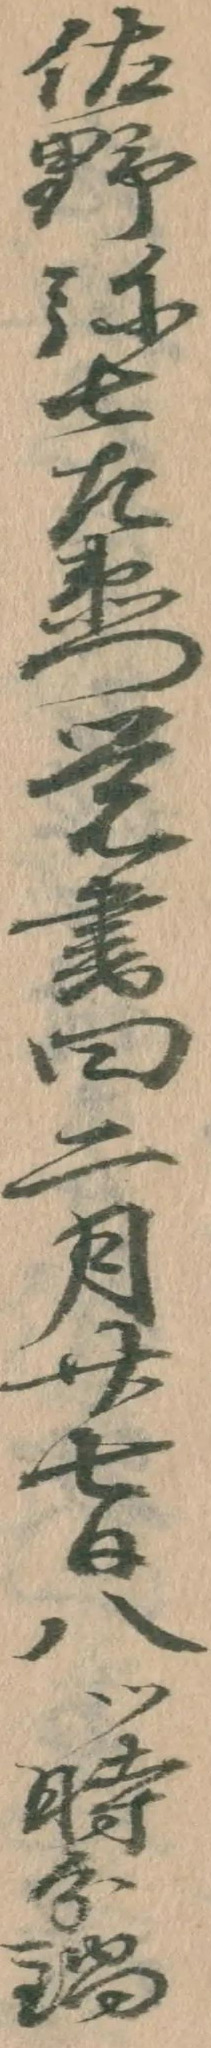佐野弥七左衛門覚書曰二月廿七日八つ時分鍋
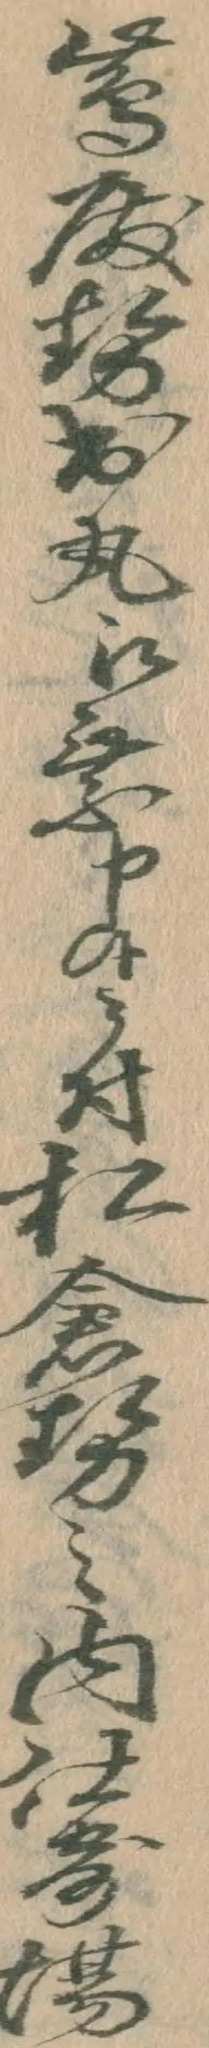島殿勢出丸江乗申候に付松倉勢之内仕寄場
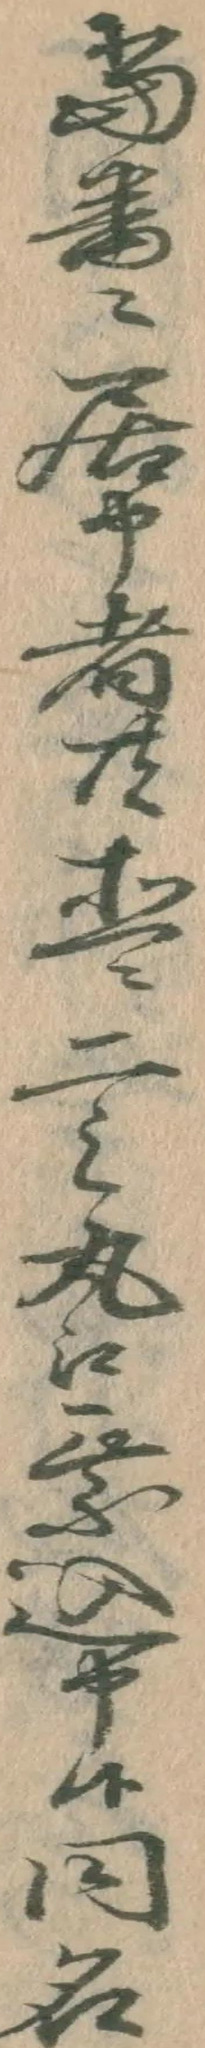当番に居申者共直に二之丸江乗込申候同名
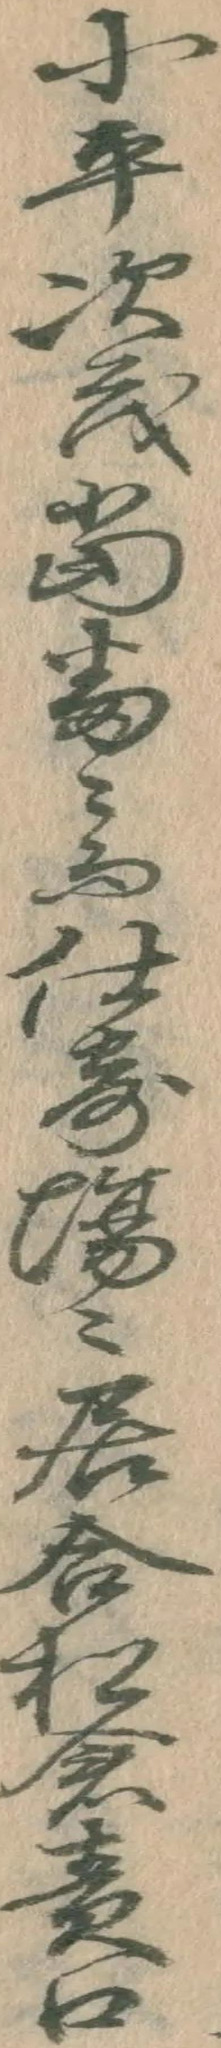小平次茂当番に而仕寄場に居合松倉責口
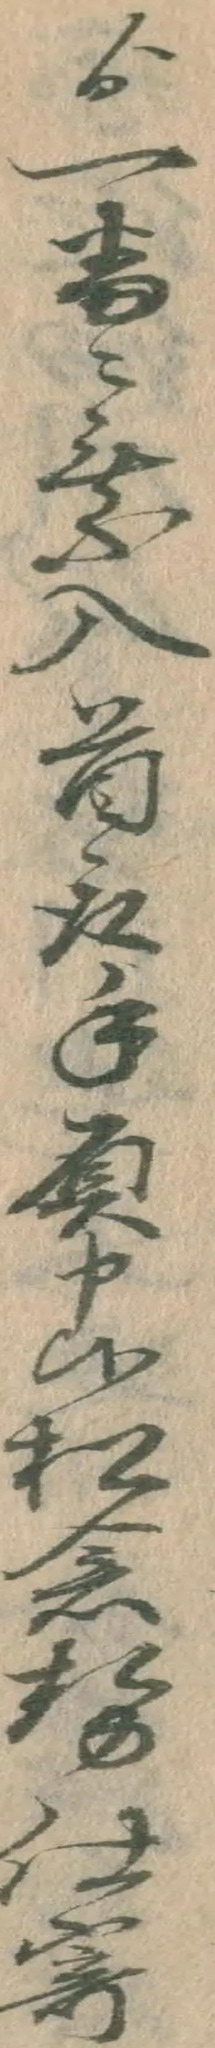ゟ一番に乗入首取手負申候松倉勢仕寄
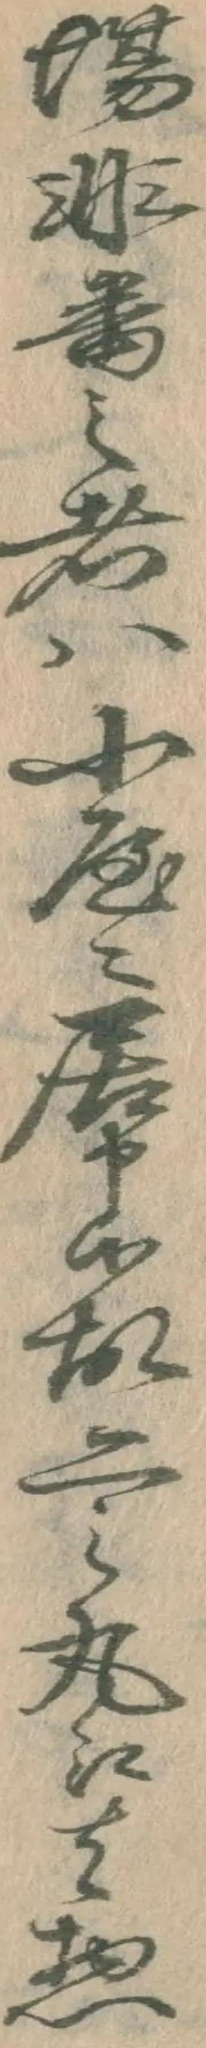場非番之者は小屋に居申候故二之丸江者惣
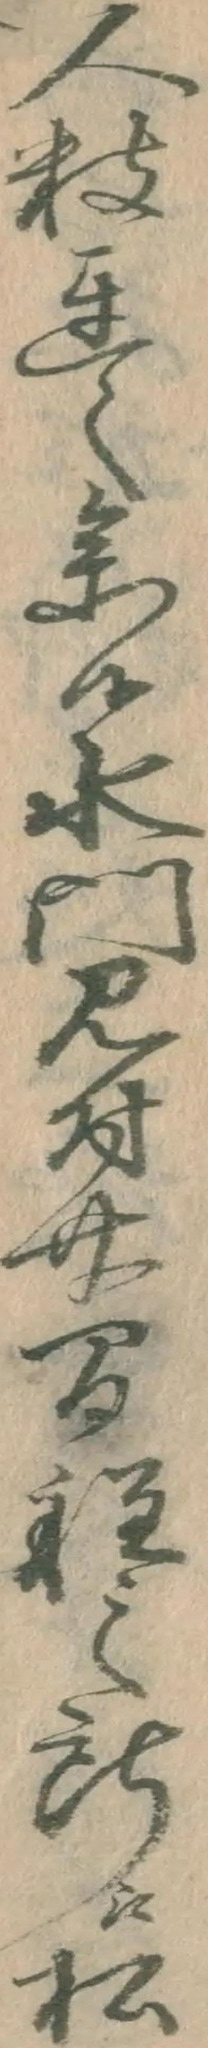人数遅く参候水門見付廿間程之所江松
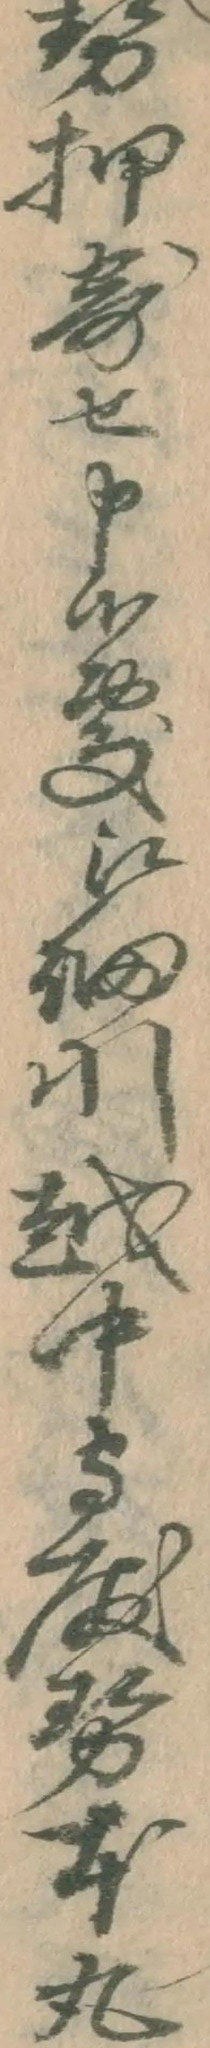倉勢押寄せ申候處江細川越中守殿本丸

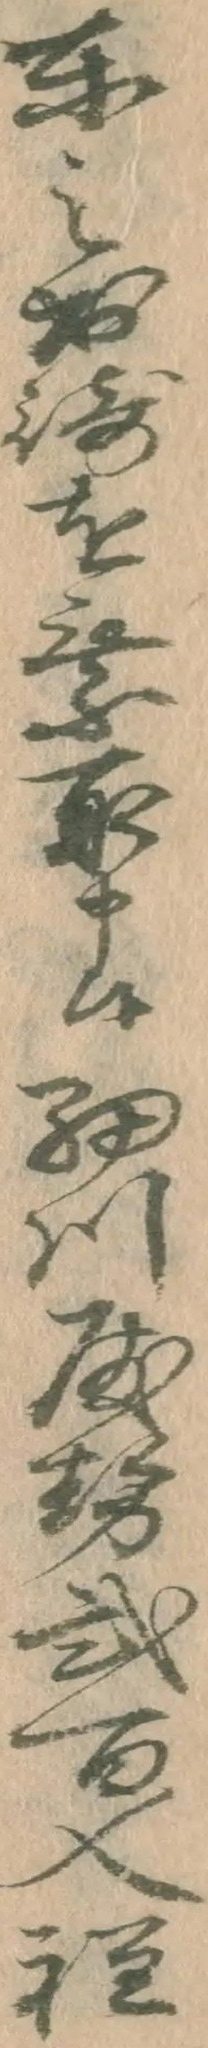東之出崎を乗取申候細川殿勢弐百人程
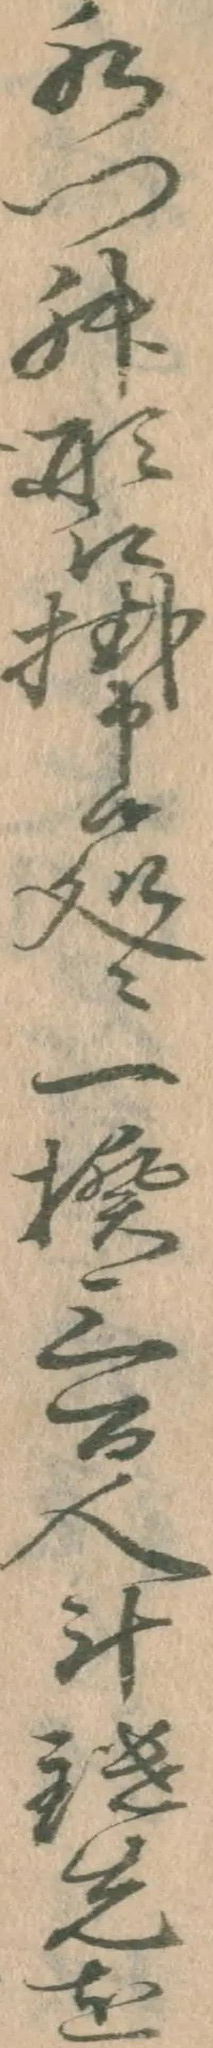水門升形江掛申候処に一揆三百人斗鑓先を
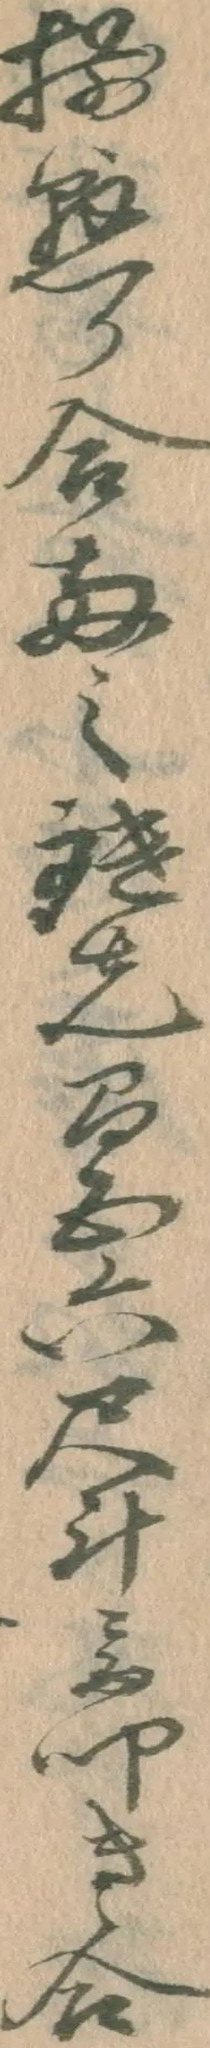操懸り合両之鑓先間五六尺斗に而叩き合
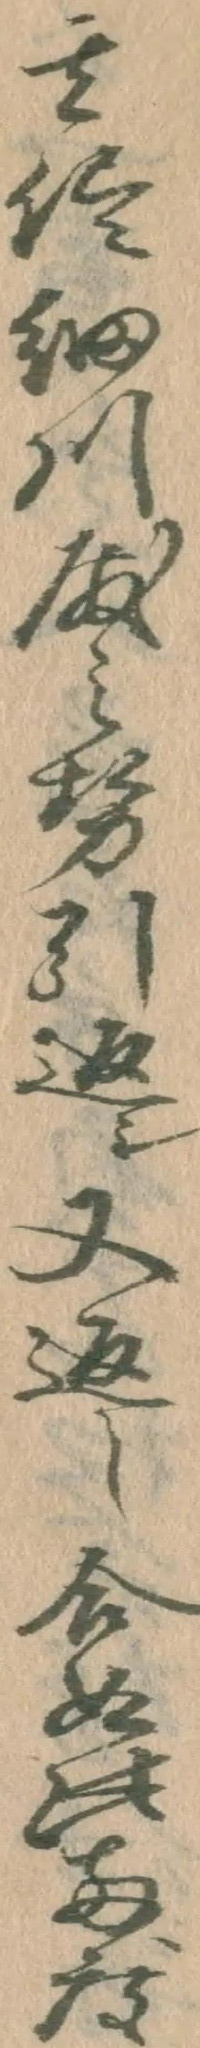其侭細川殿之勢引返し又返し合如此両度
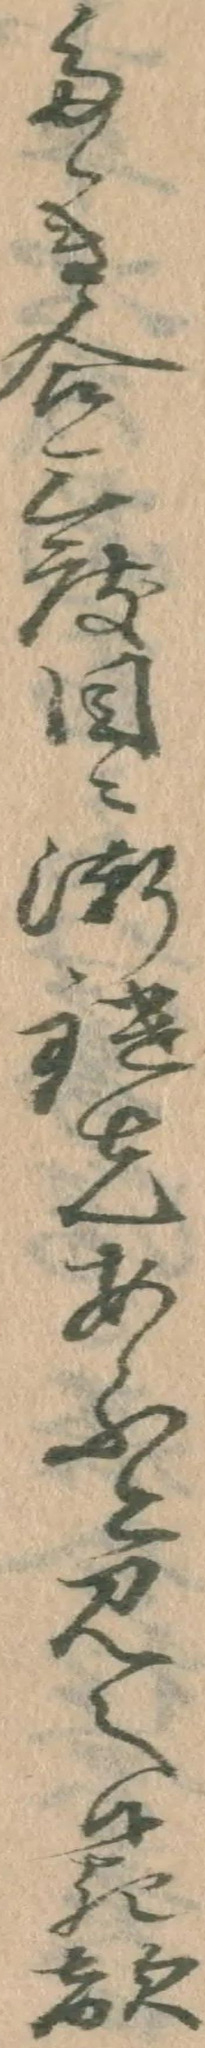多々き合三度目に漸鑓先あふと見へ候歟敵
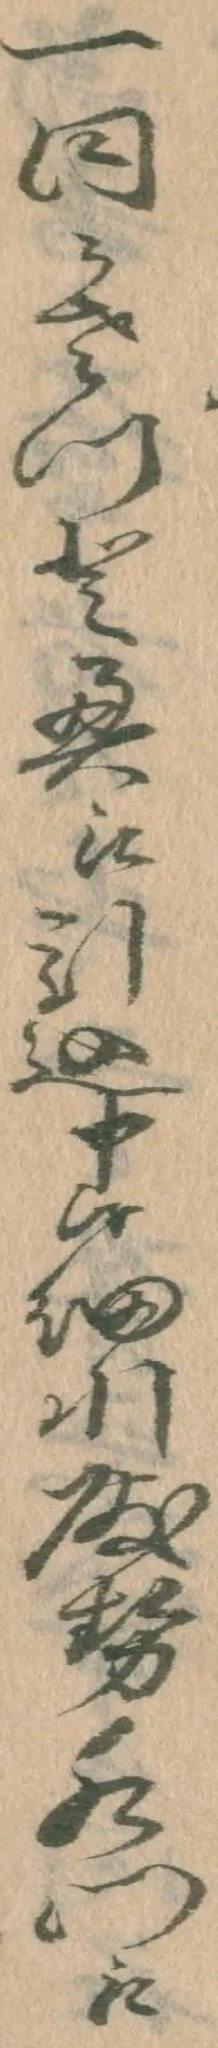一同にさ川登奥江引込申候細川殿勢水門江
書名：切支丹御退治記 49巻. [8]
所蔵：国立国会図書館 National Diet Library, JAPAN
